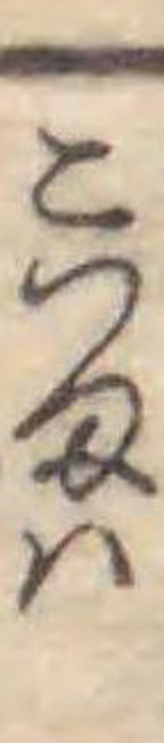こつまは
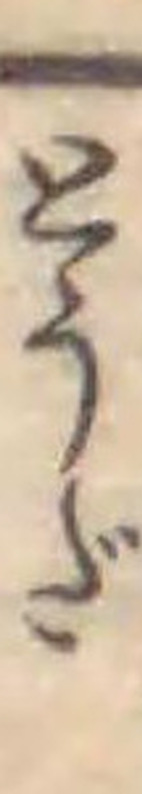とうだ
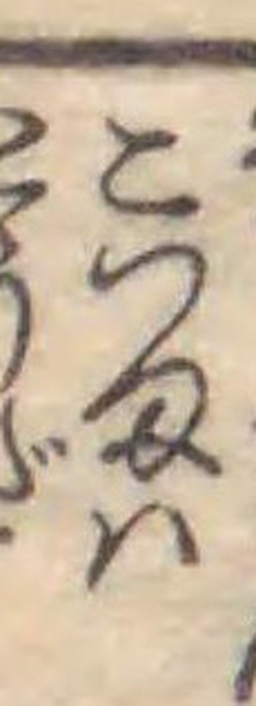とうだ
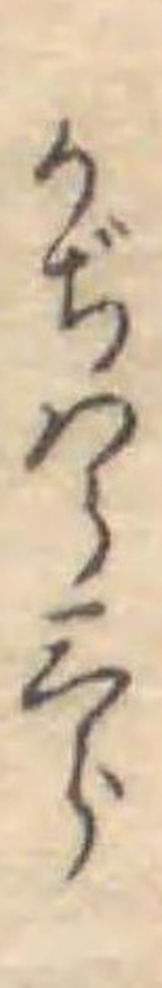かぢはら三郎

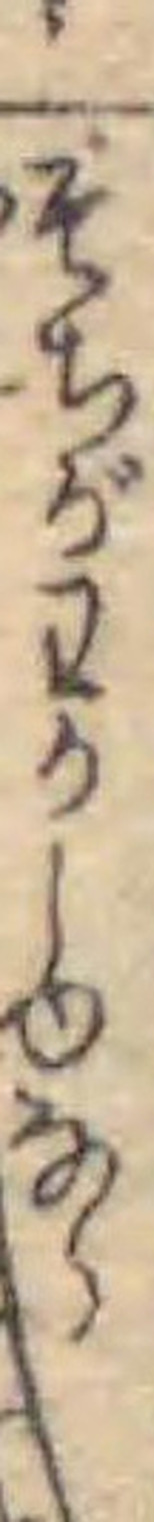そちがわかしゆなら
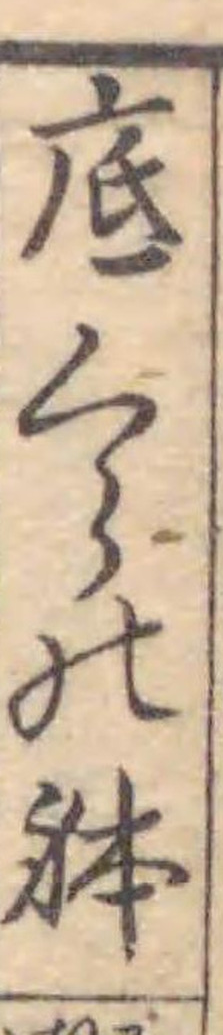底くらの鉢
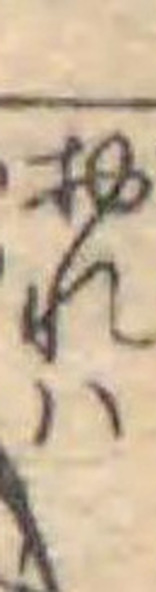おれは
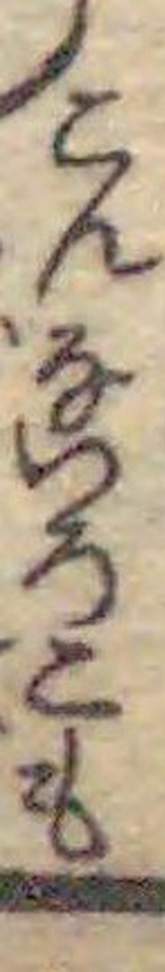こんないろこも
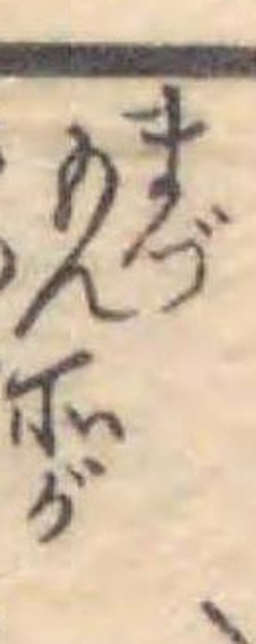もん所が
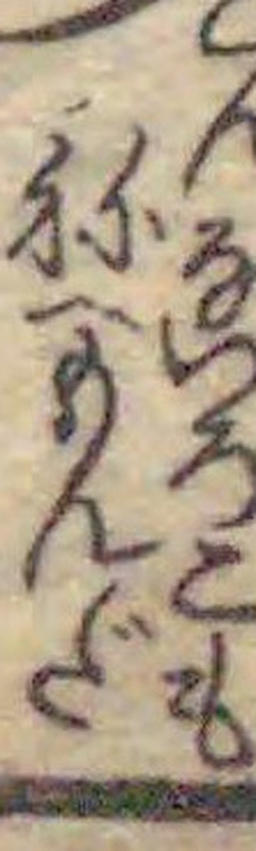ねへもんだ
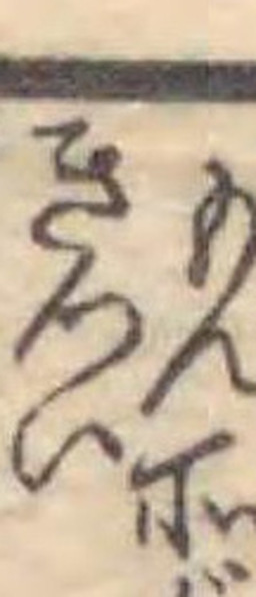きつい
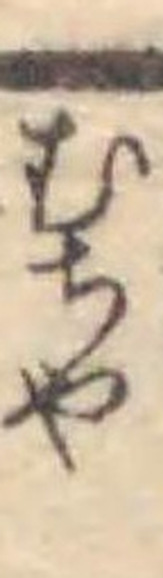むちや
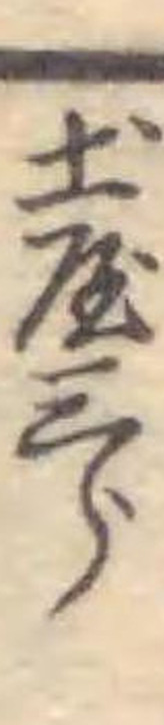土屋三郎
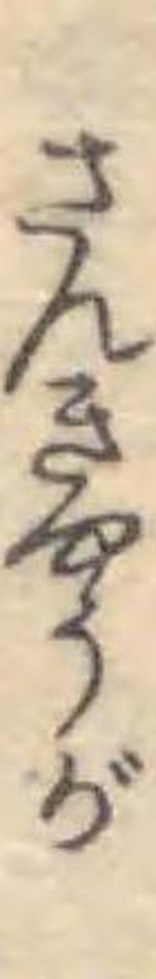さんきやうが
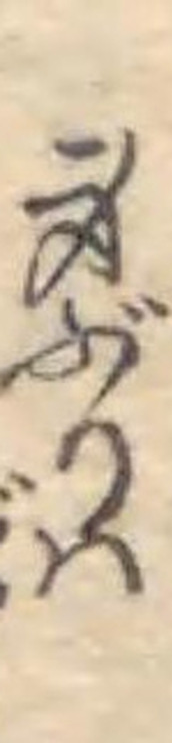身ぶりは
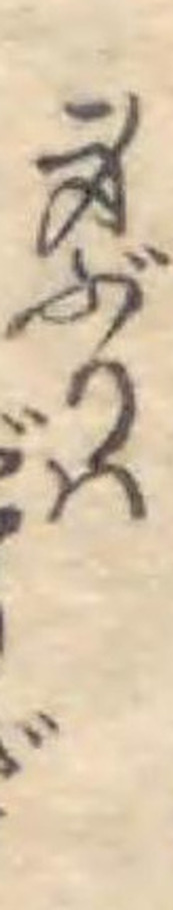身ぶりは
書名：文武二道万石通 : 3巻
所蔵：国立国会図書館 National Diet Library, JAPAN
